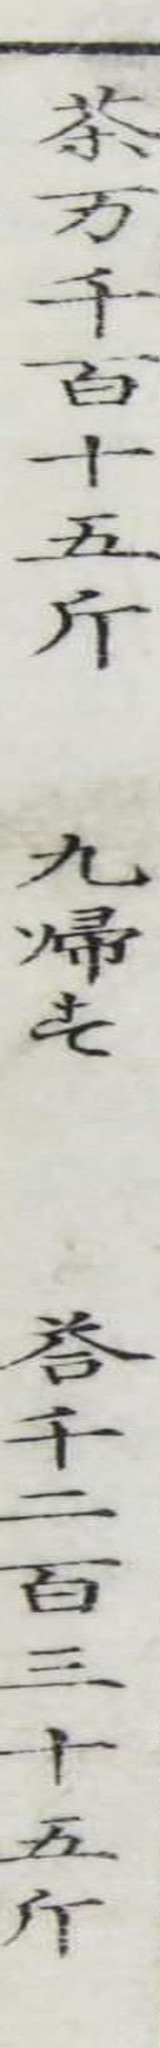茶万千百十五斤九帰す答千二百三十五斤
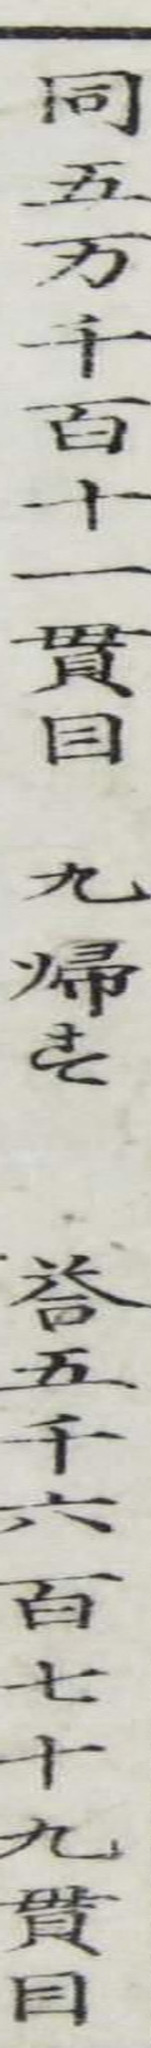同五万千百十一貫目九帰す答五千六百七十九貫目
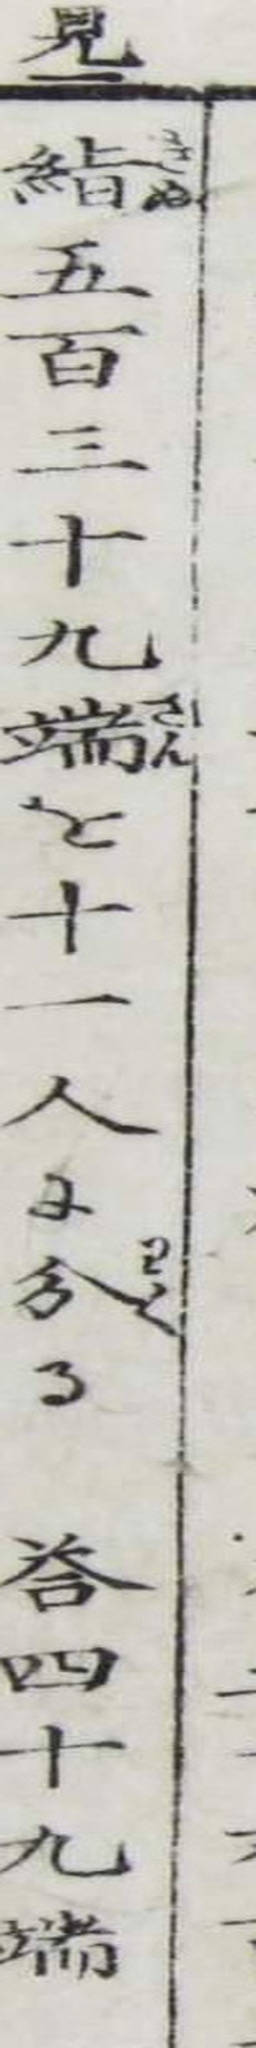絹五百三十九端を十一人に分る答四十九端
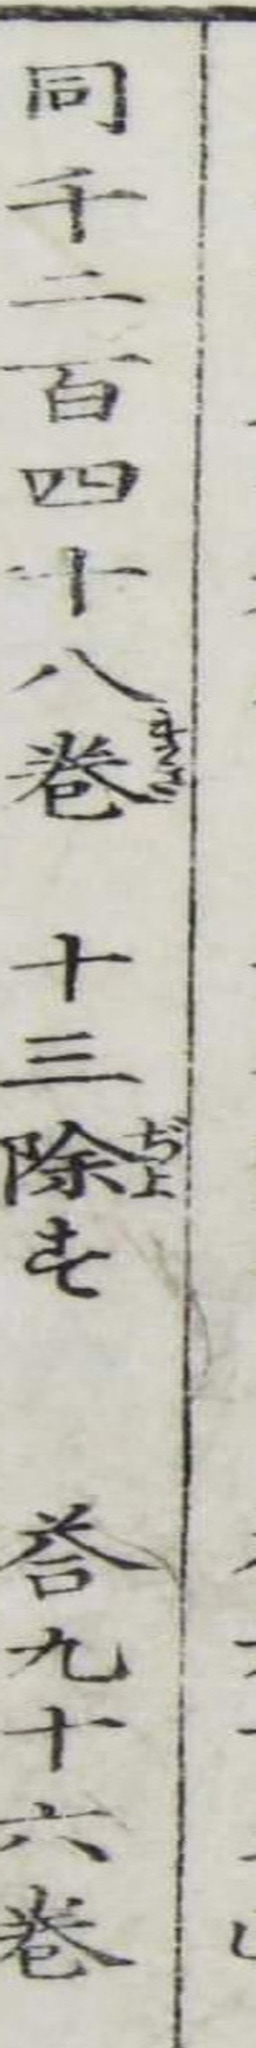同千二百四十八巻十三除す答九十六巻

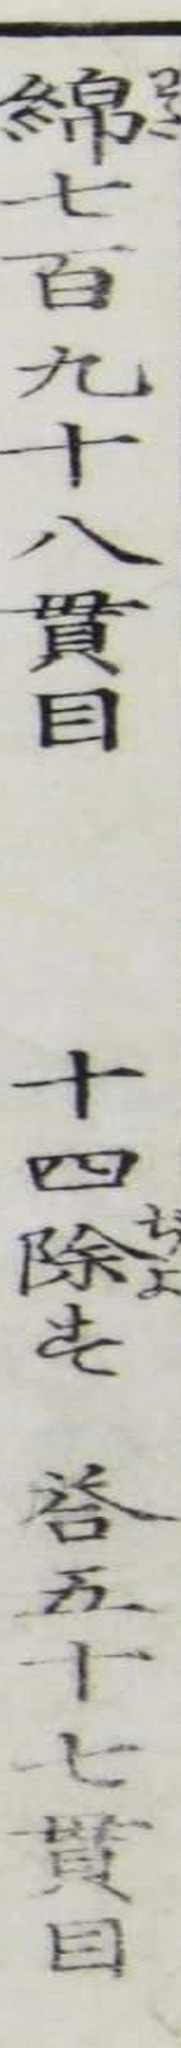綿七百九十八貫目十四除す答五十七貫目
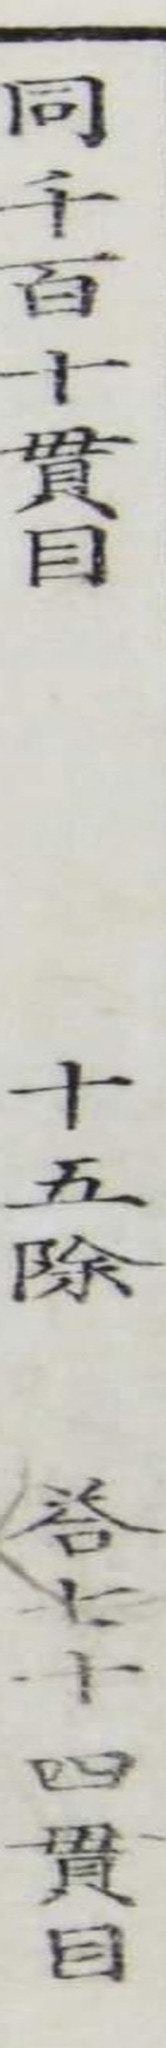同千百十貫目十五除答七十四貫目
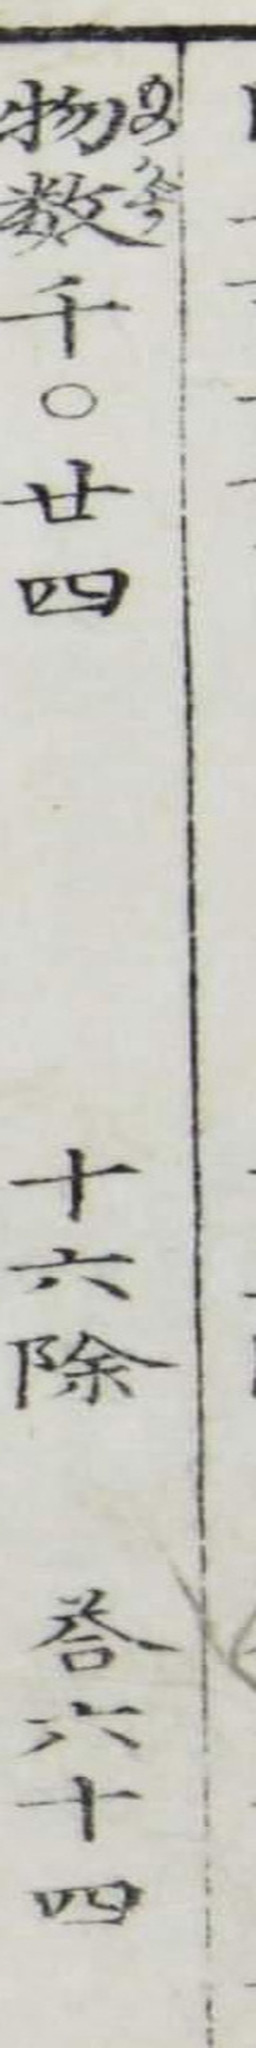物数千〇廿四十六除答六十四
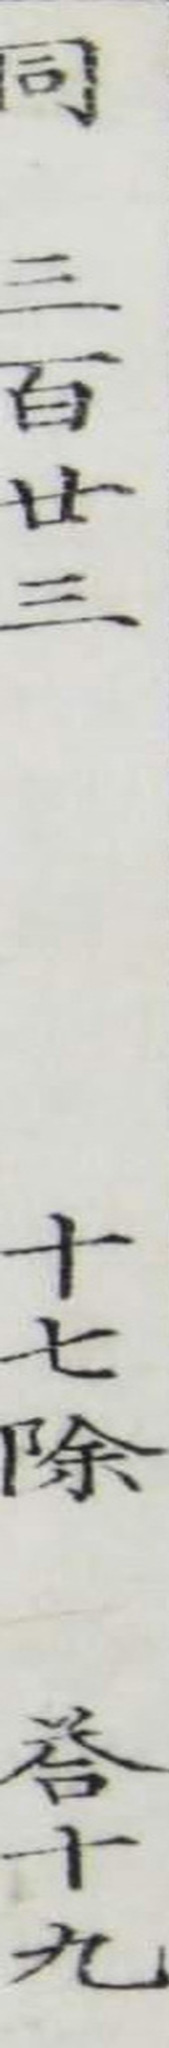同三百廿三十七除答十九
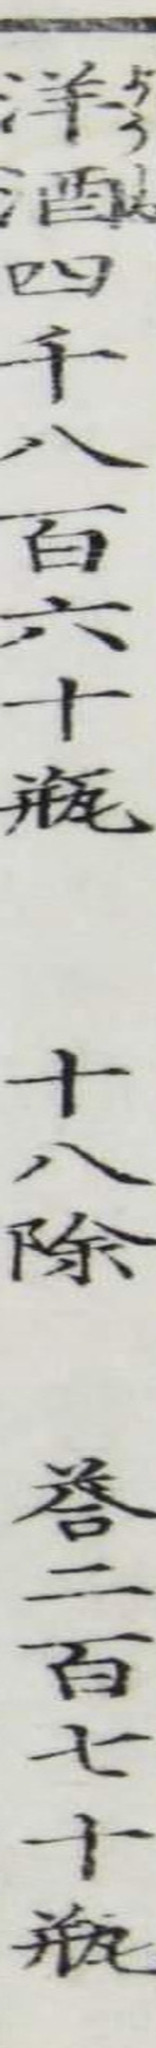洋酒四千八百六十瓶十八除答二百七十瓶
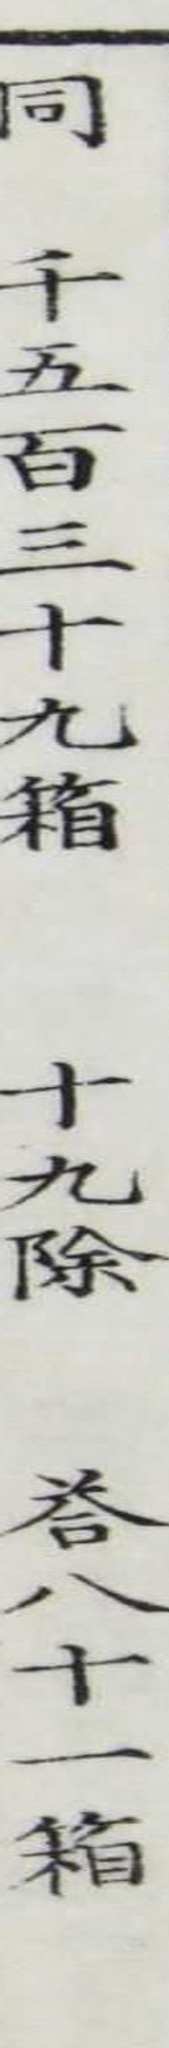同千五百三十九箱十九除答八十一箱
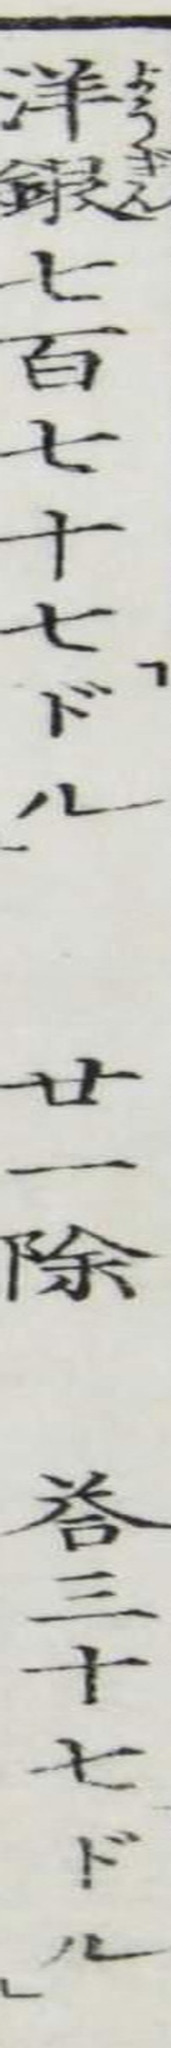洋銀七百七十七「ドル」廿一除答三十七「ドル」
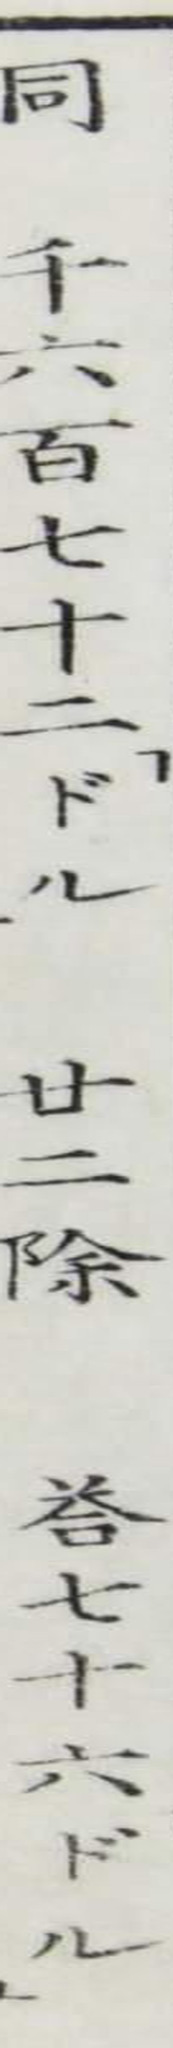同千六百七十二「ドル」廿二除答七十六「ドル」
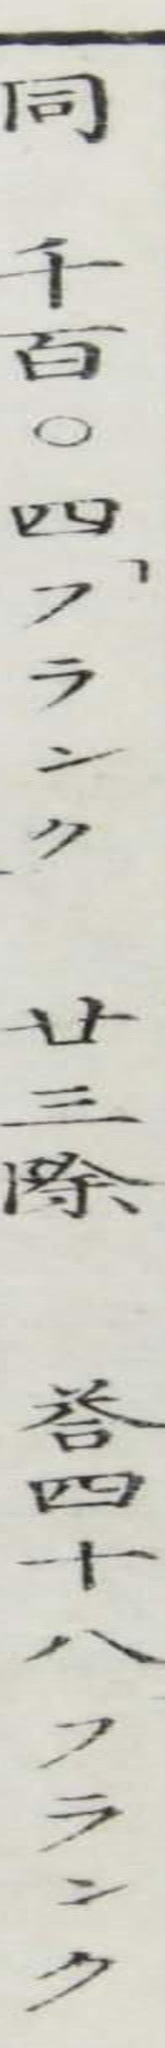同千百〇四「フランク」廿三除答四十八「フランク」
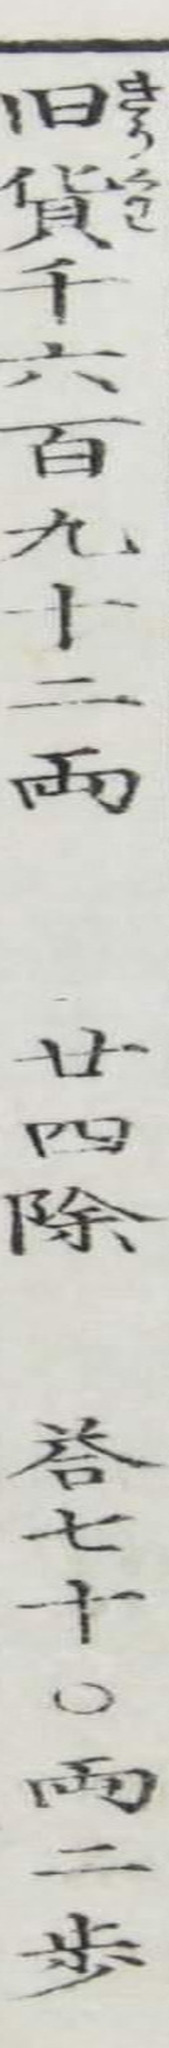旧貨千六百九十二両廿四除答七十〇両二歩
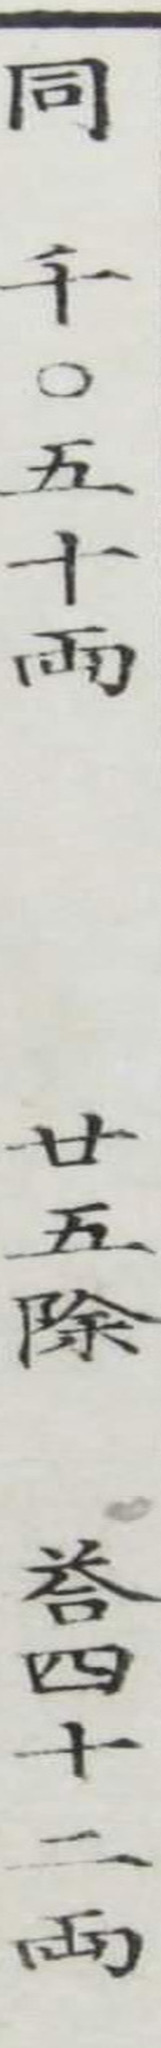同千〇五十両廿五除答四十二両
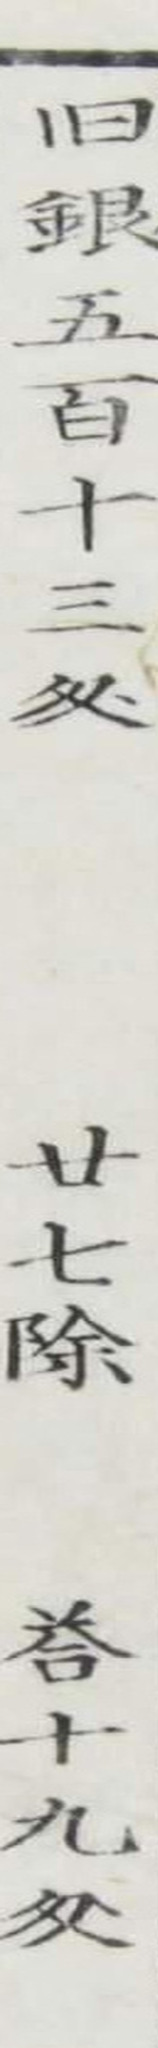旧銀五百十三匁廿七除答十九匁
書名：明治小學塵劫記 卷1
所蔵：東京学芸大学教育コンテンツアーカイブ
